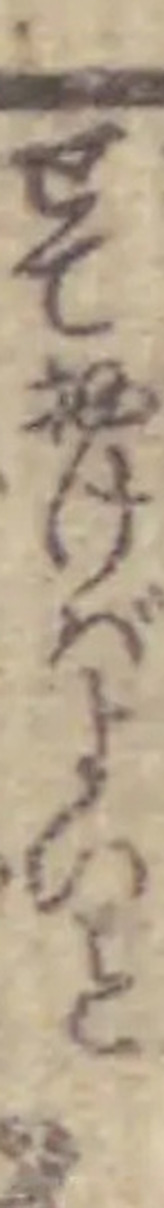せておけばよいと
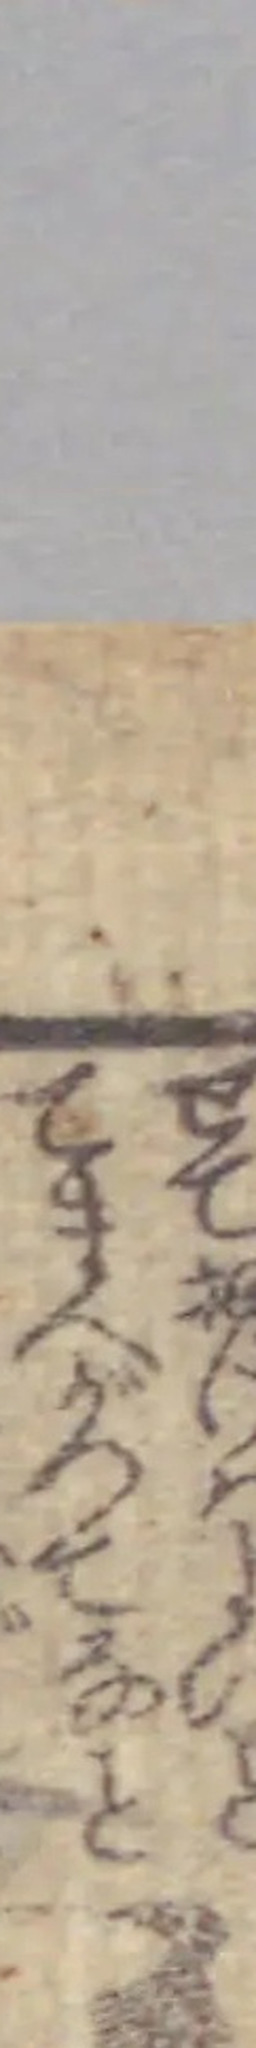てまへがつてなこと
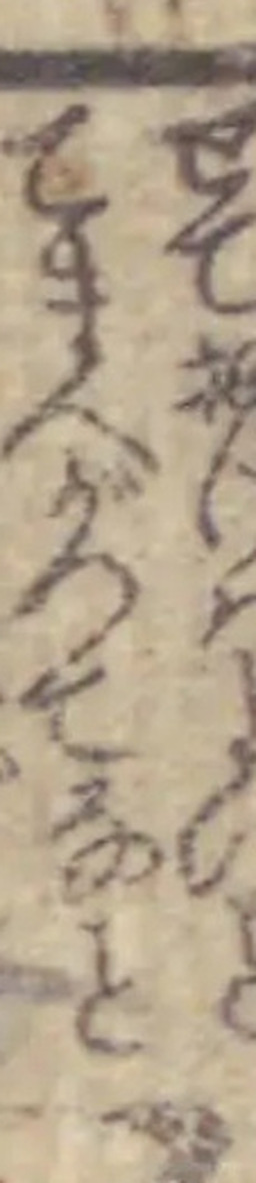てまへがつてなこと
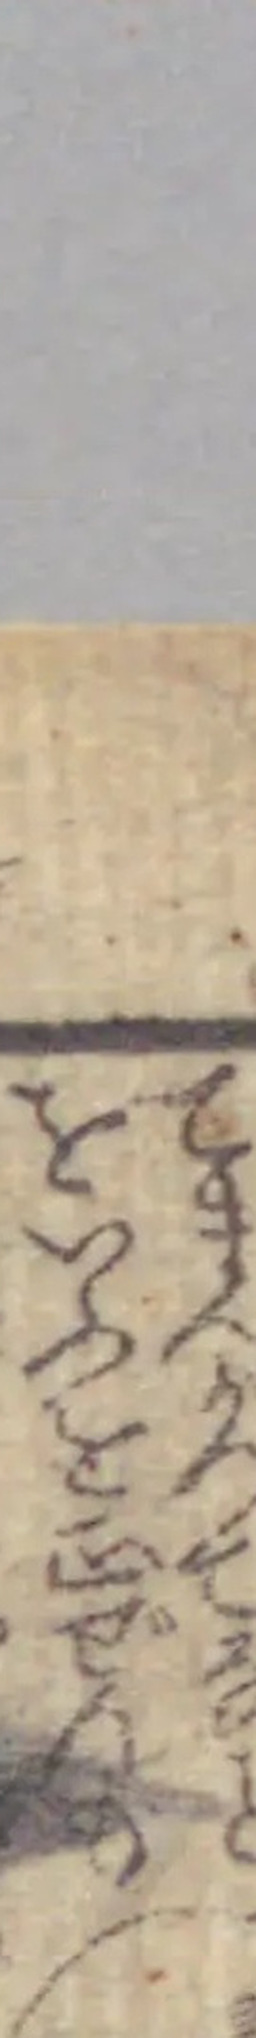をいふを正ぜんも
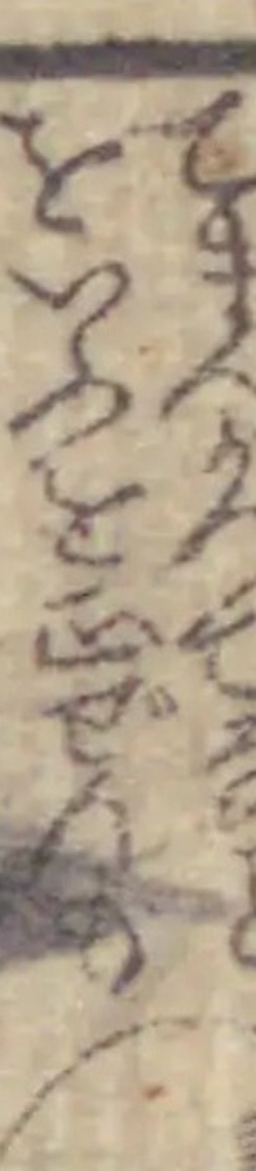をいふを正ぜんも
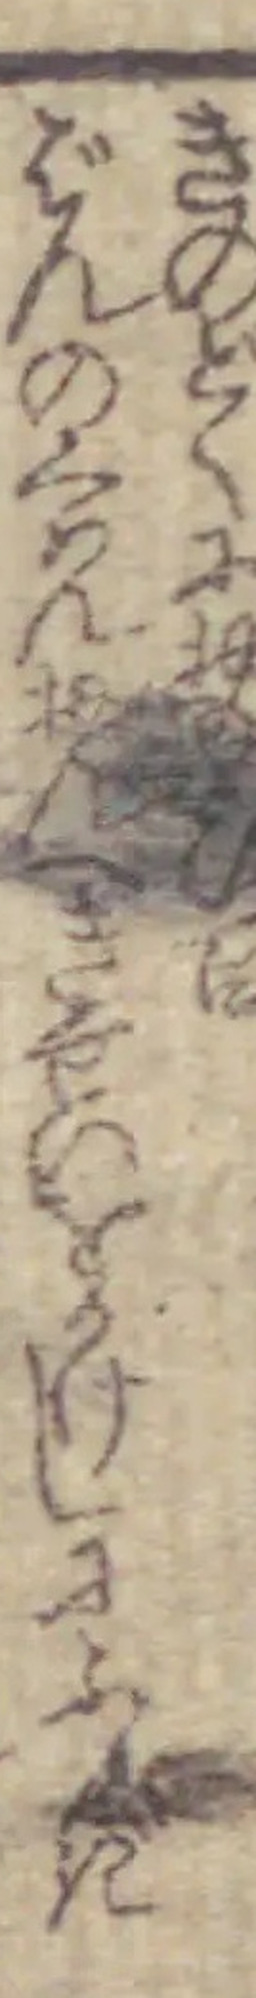ばんのくはんおんへきせいをかけしにふしぎ
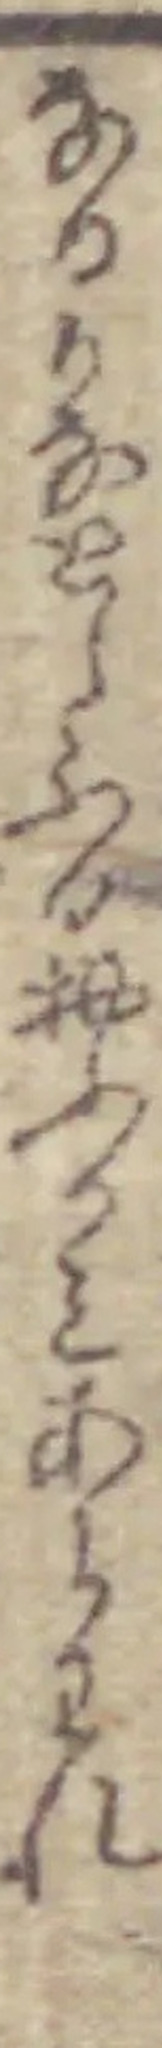なるかなとしふるおふかみあらわれ
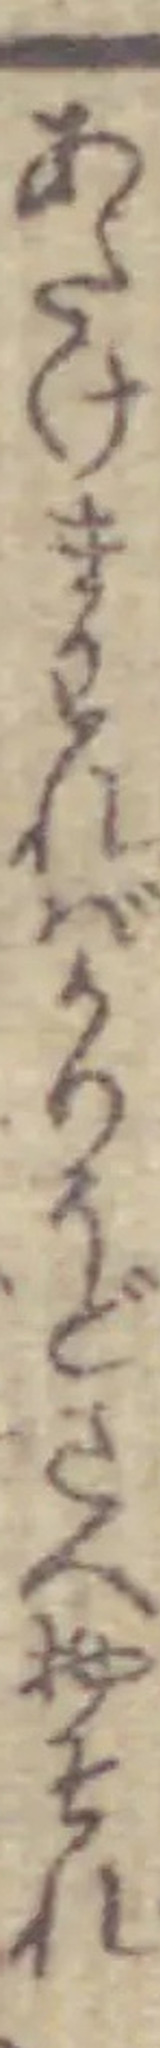あたけまわればかりうどさへおそれ
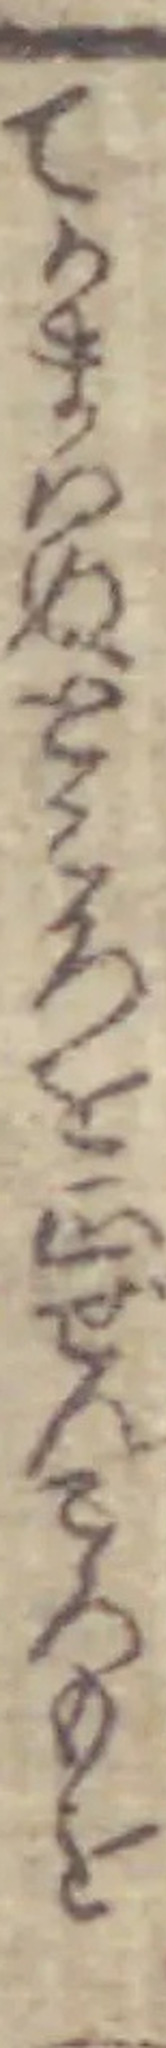てかまはぬところを正ぜんころもを
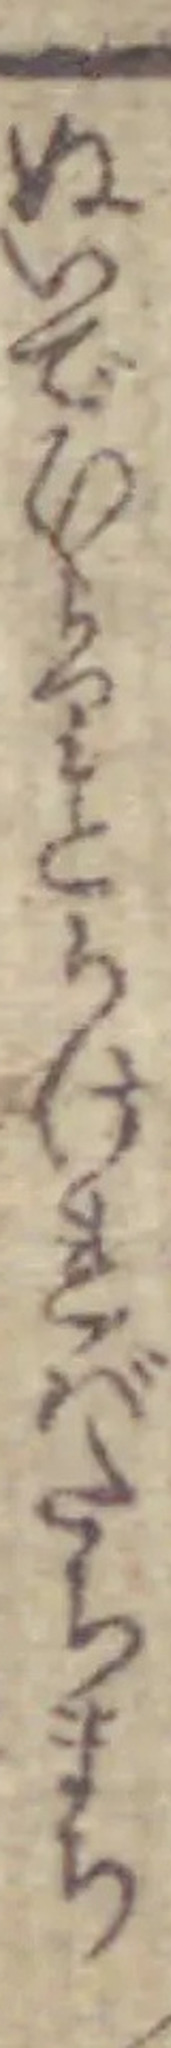ぬいでひらりとかければたちまち
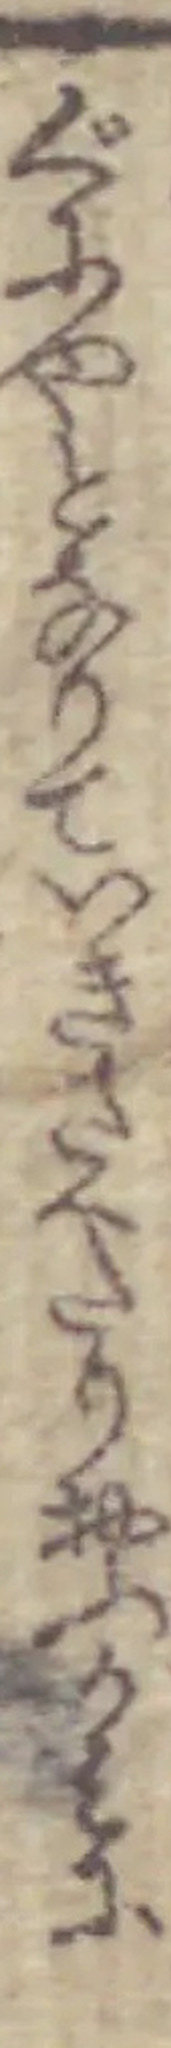ぐにやとなりていきたへたりおふかみに
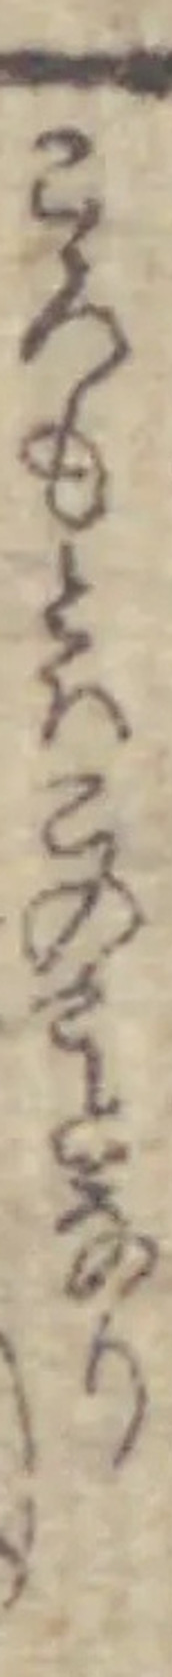ころもとはこのことなり
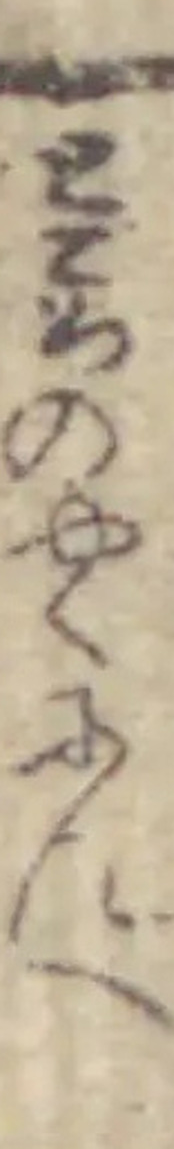ところのやくにんへ
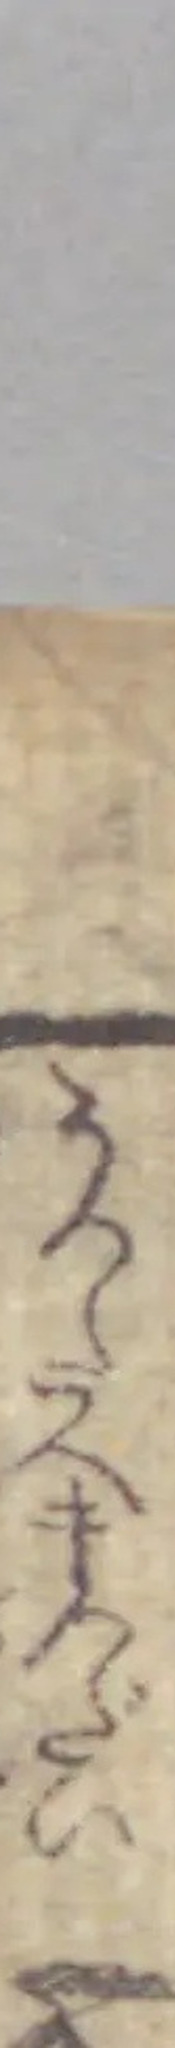うつたへまつだい
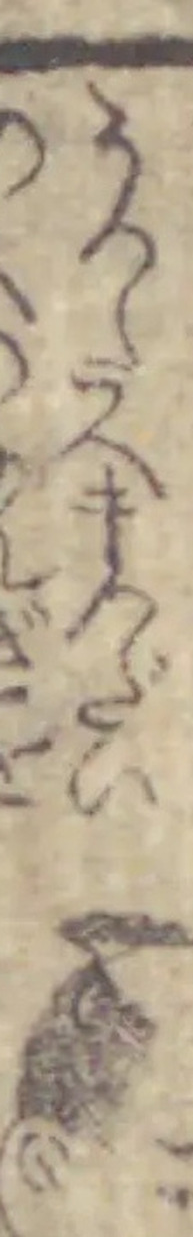うつたへまつだい
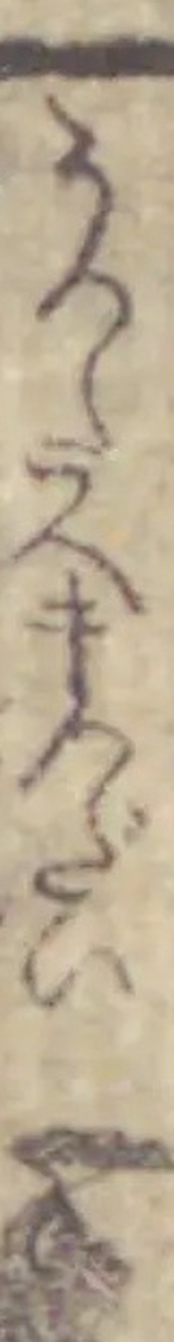うつたへまつだい
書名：もふもふもふ怖噺 2巻
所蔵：国立国会図書館 National Diet Library, JAPAN
